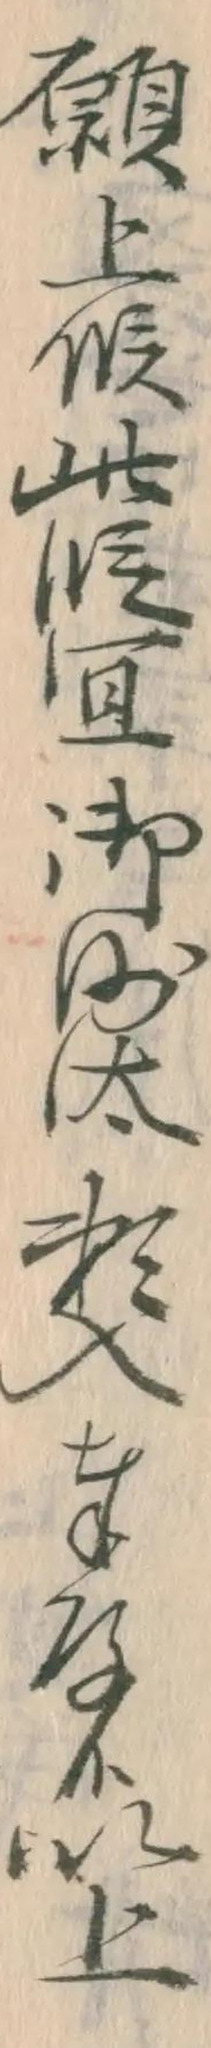願上候此段宜御沙汰頼入奉存候以上
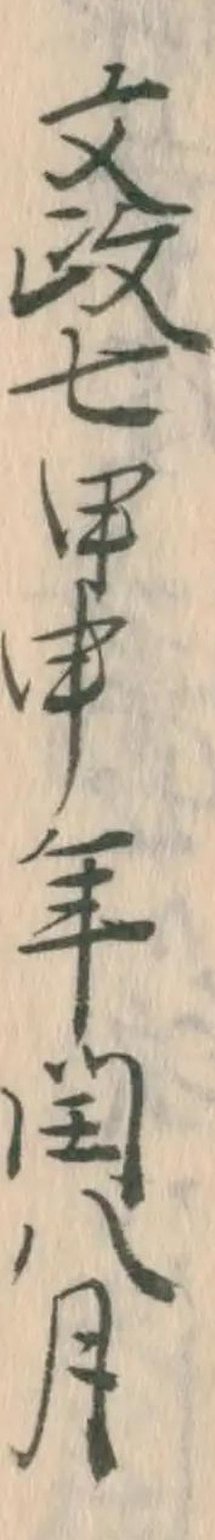文政七甲申年閏八月
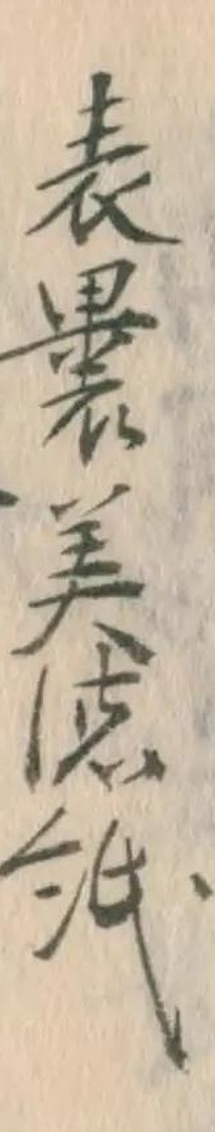表褁美濃紙
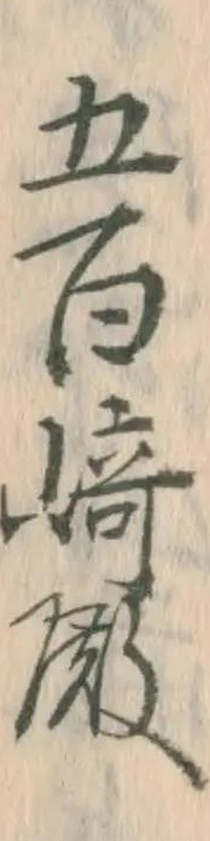五百崎殿
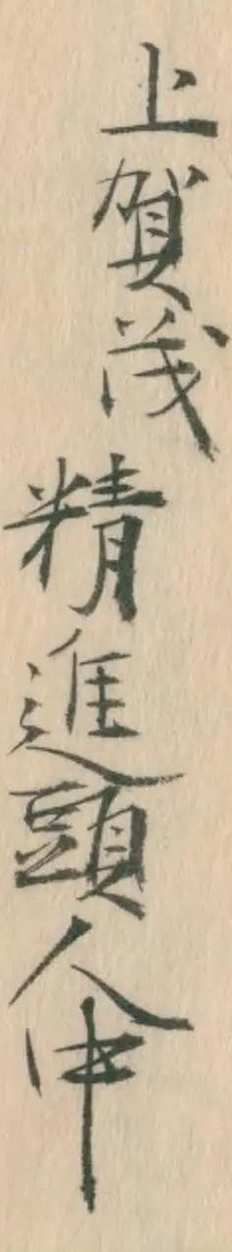上賀茂精進頭人中
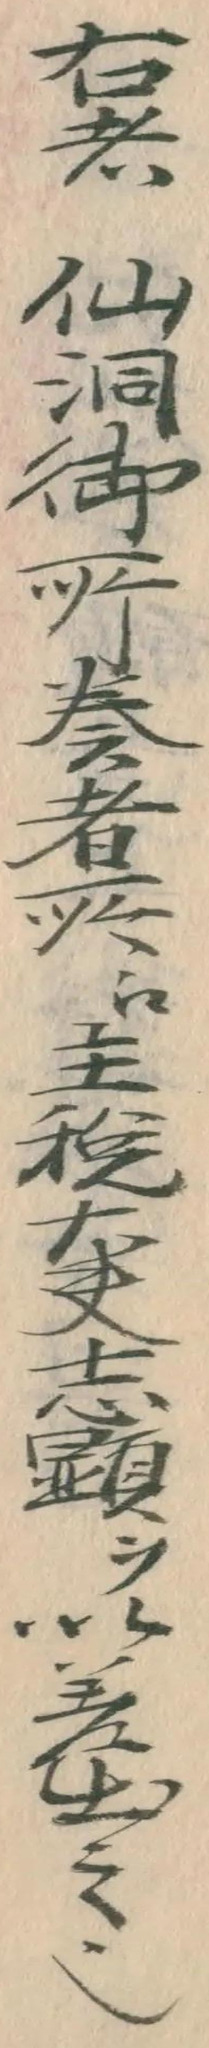右は仙洞御所奏者所え主税大夫志顕ヲ以差出之也

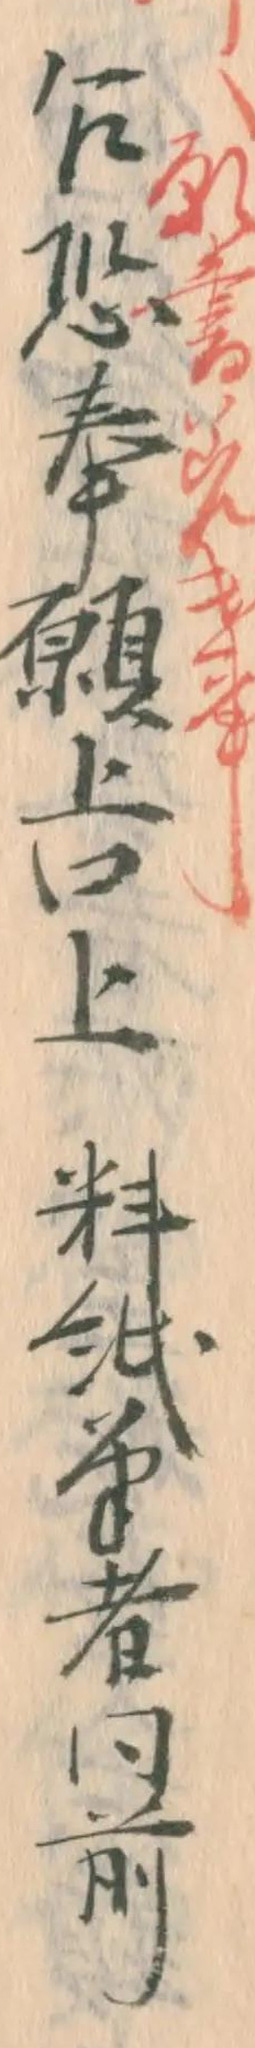乍恐奉願上口上料紙筆者同前
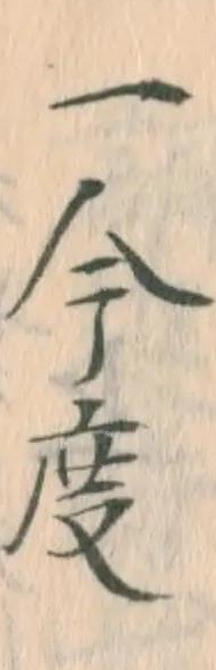一今度
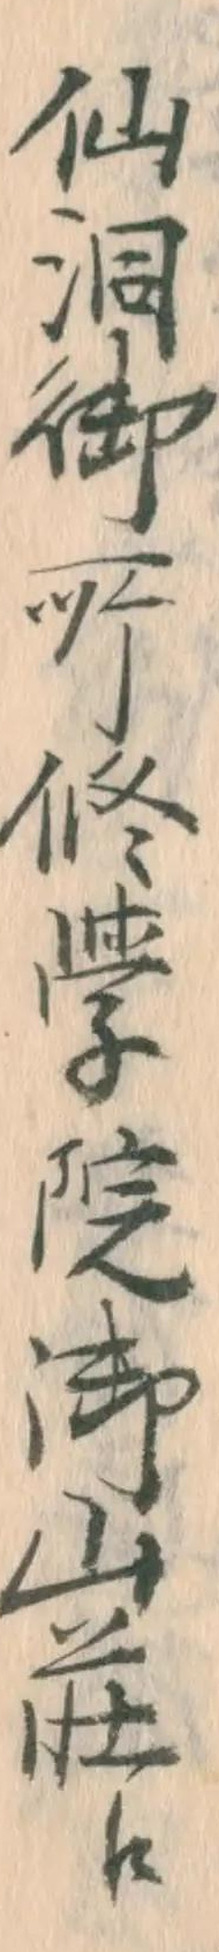仙洞御所修學院御山荘え
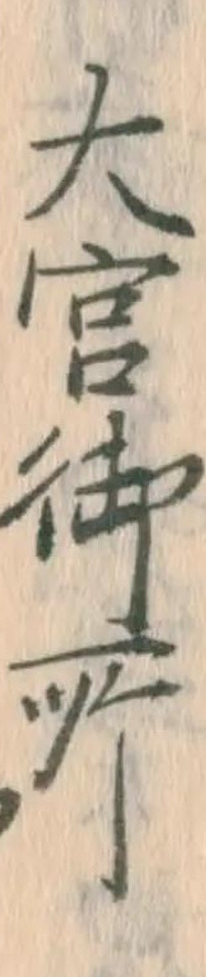大宮御所
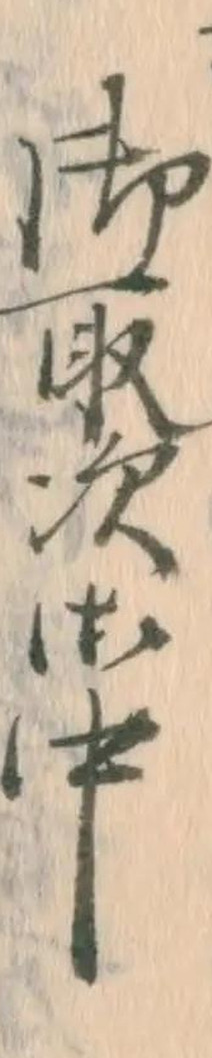御取次御中
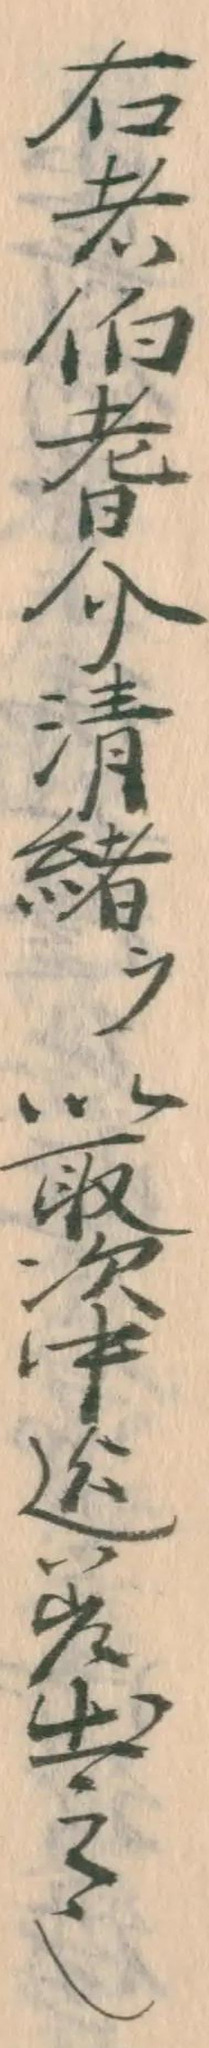右は伯耆介清緒ヲ以取次中迄差出之也
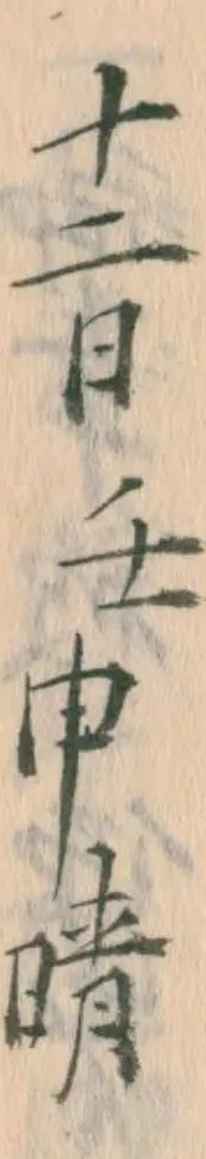十二日壬申晴
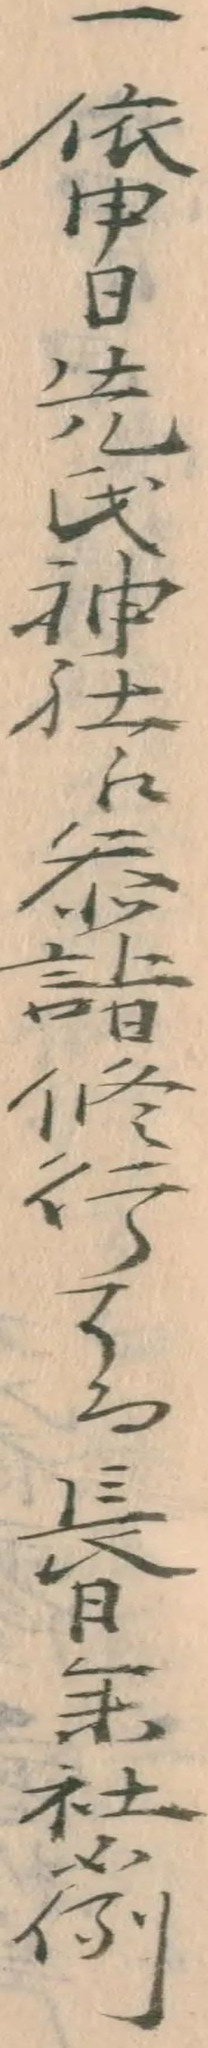一依申日先氏神社え参詣修行了而長月参社如例
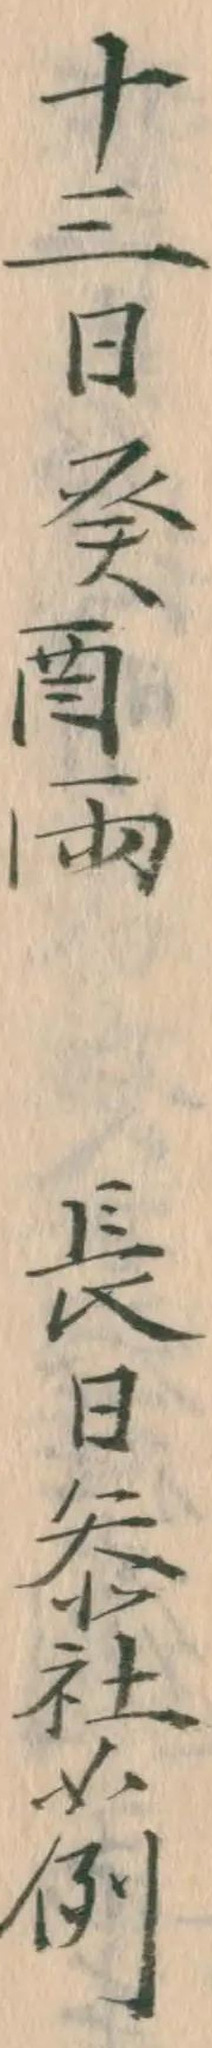十三日癸酉雨長日参社如例
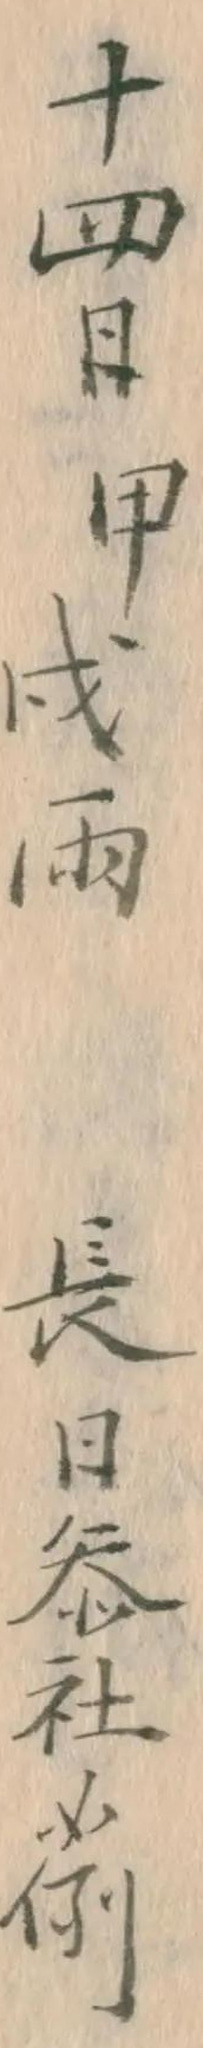十四日甲戌雨長日参社如例
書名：賀茂社記録. 第73冊
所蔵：国立国会図書館 National Diet Library, JAPAN
